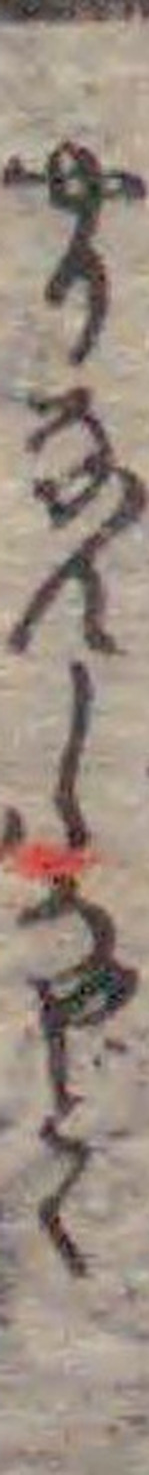やりなんしなどゝ
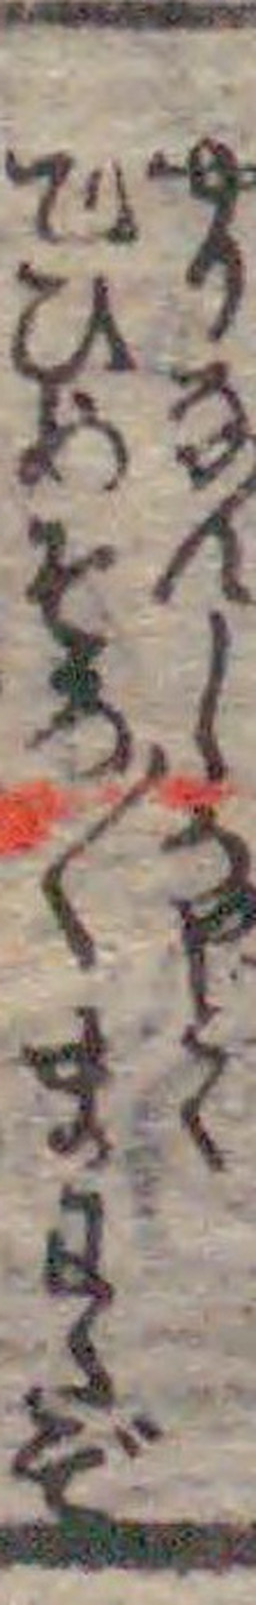乙ひめそろ〳〵まわたで
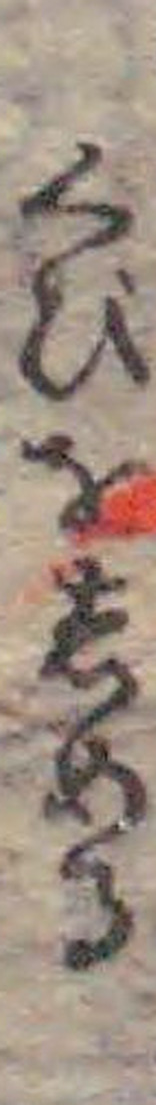くびをしめる

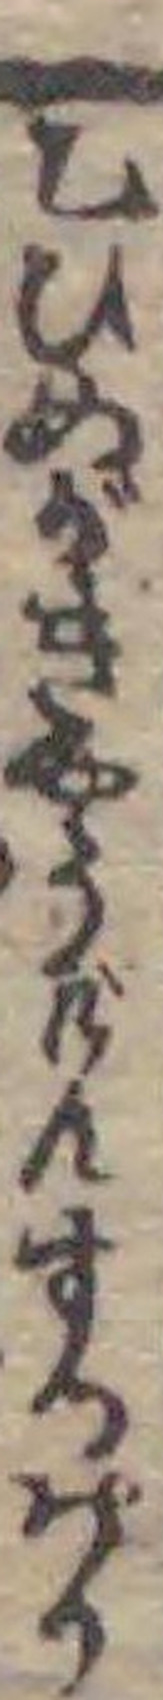乙ひめがきやうげんすつかり
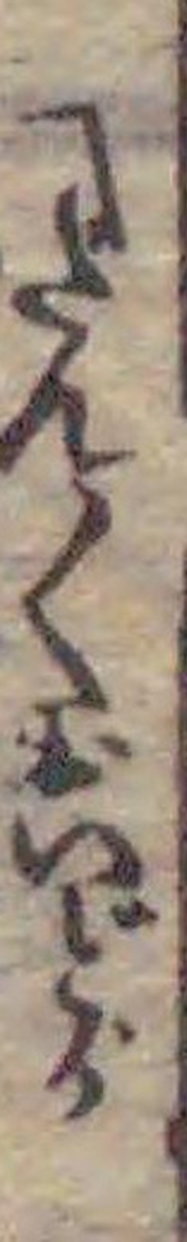〽だん〳〵おいどが
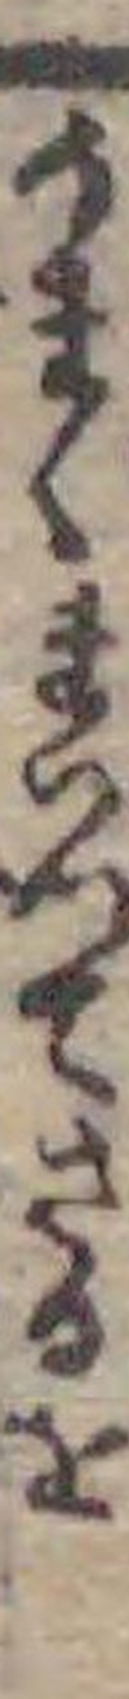うまくまいつてさるを
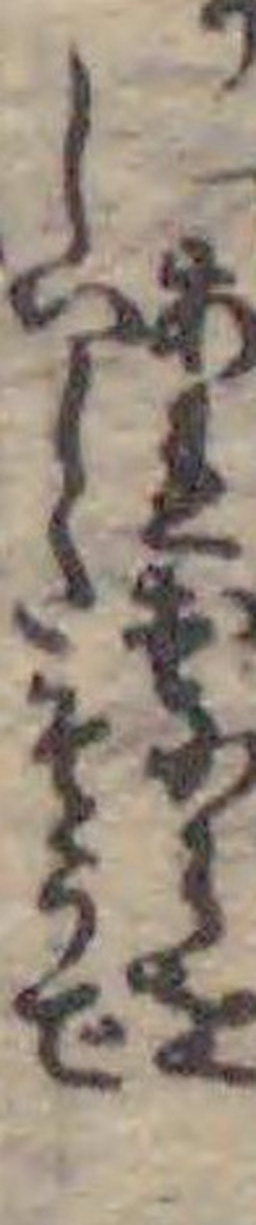しいしたそうで
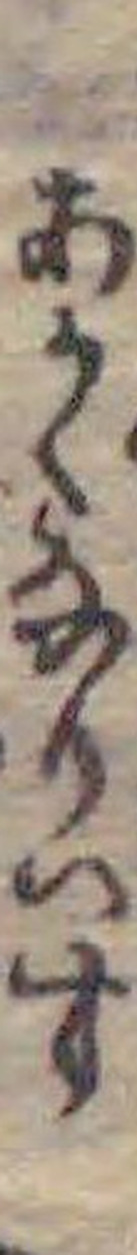あかくなりいす
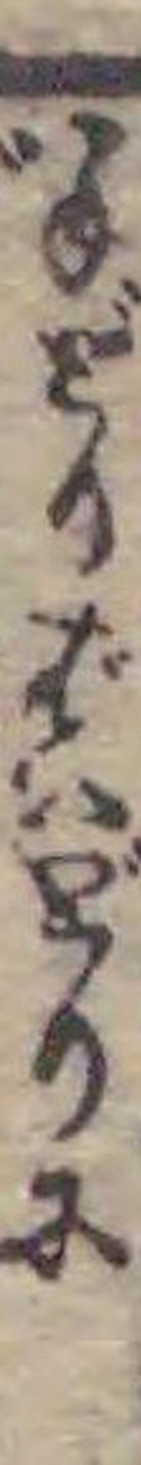手どりばいどりに
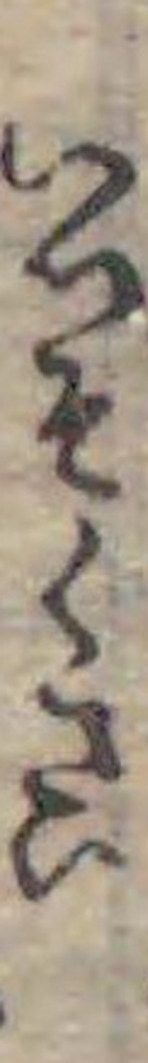いつそくさい
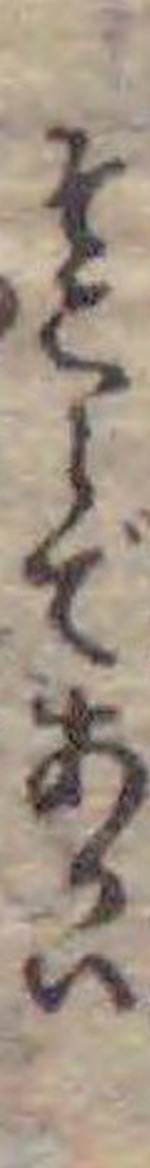そこらであかい
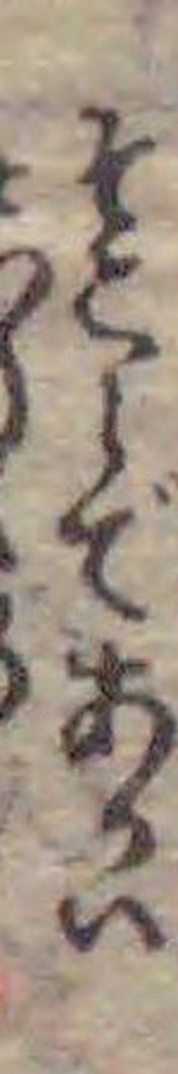そこらであかい
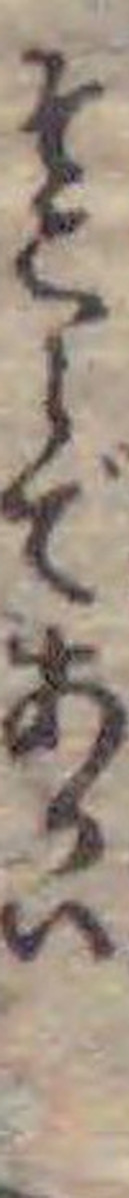そこらであかい
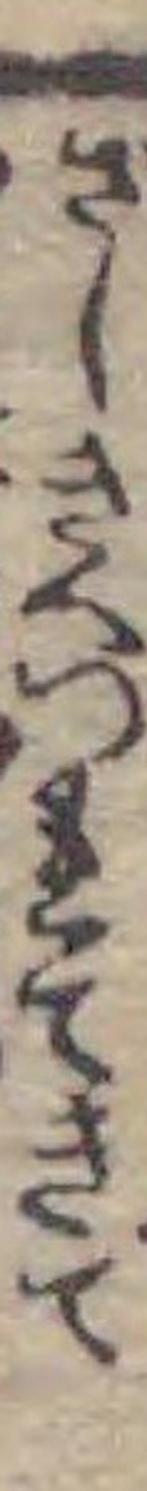ざしきへつれてきて
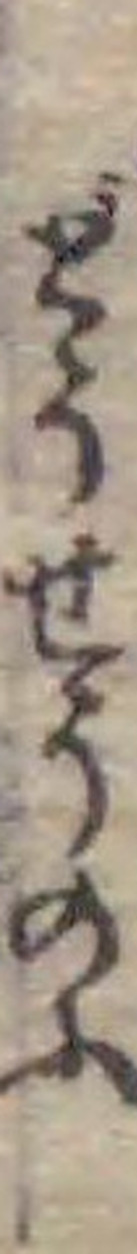どうせうのふ
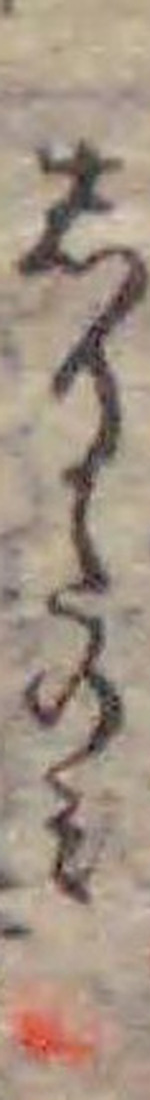しりたのみ
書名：竜宮苦界玉手箱 : 3巻
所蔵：国立国会図書館 National Diet Library, JAPAN
